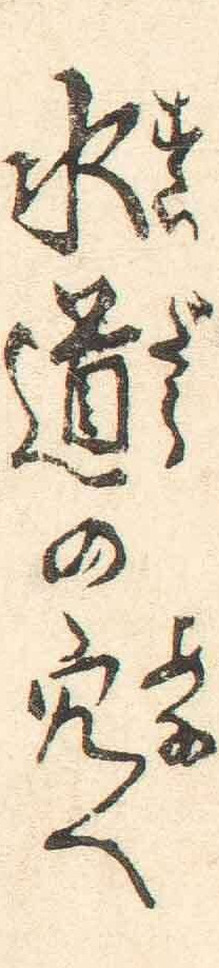水道の穴へ
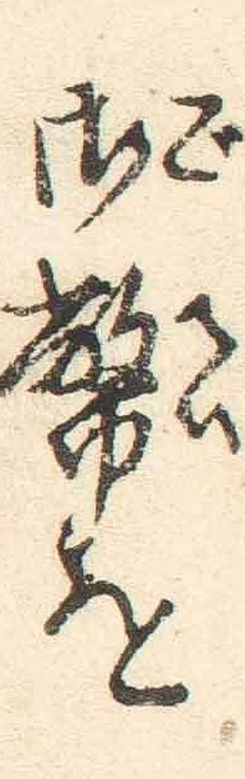御幣を
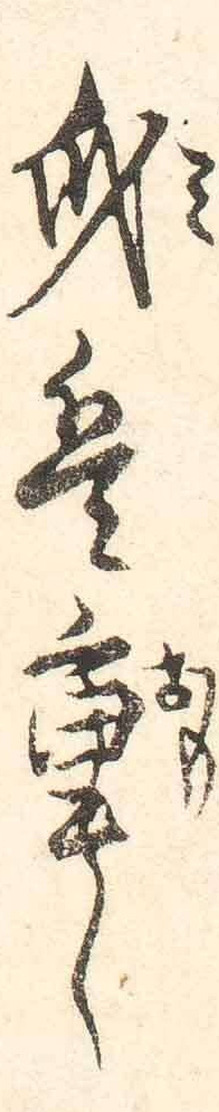身は重し
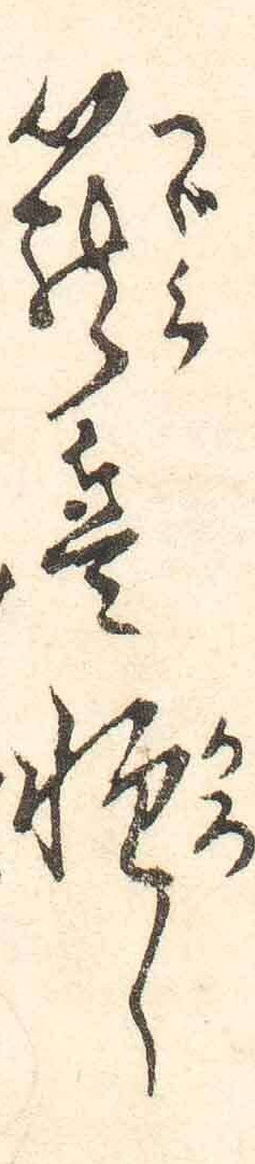籠は軽し
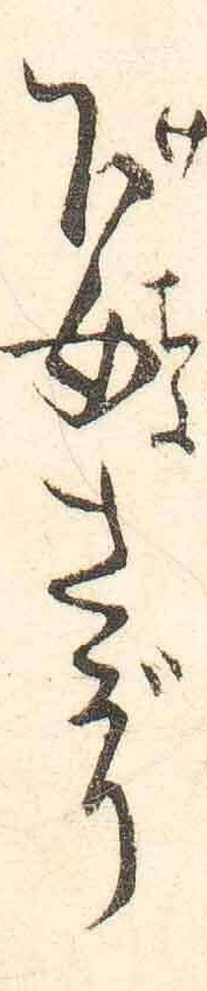下女さがり
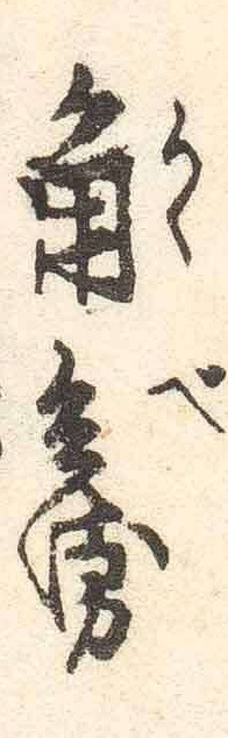角兵衛
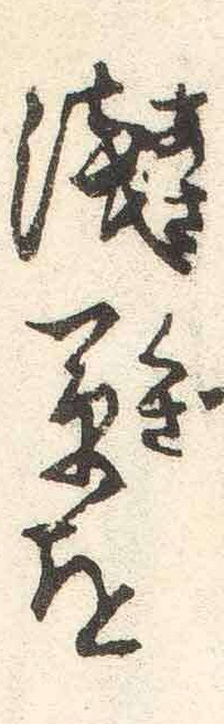浅草を
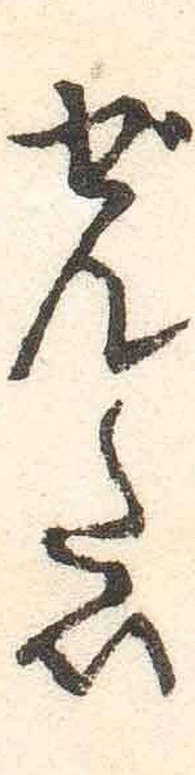ぜんたい
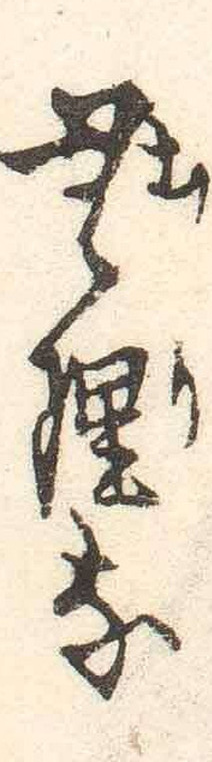無理な
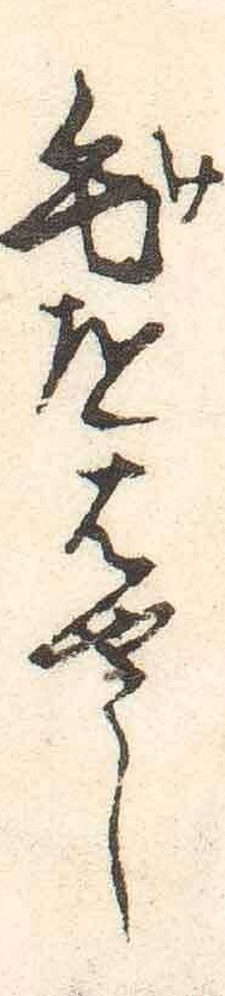毛をはやし
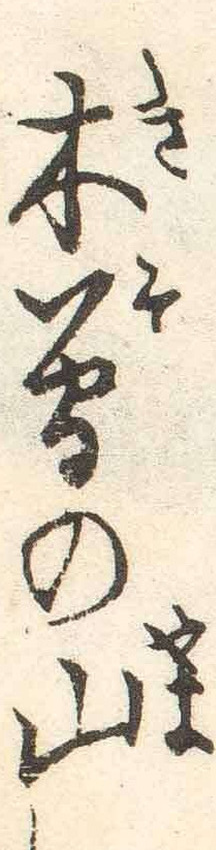木曽の山
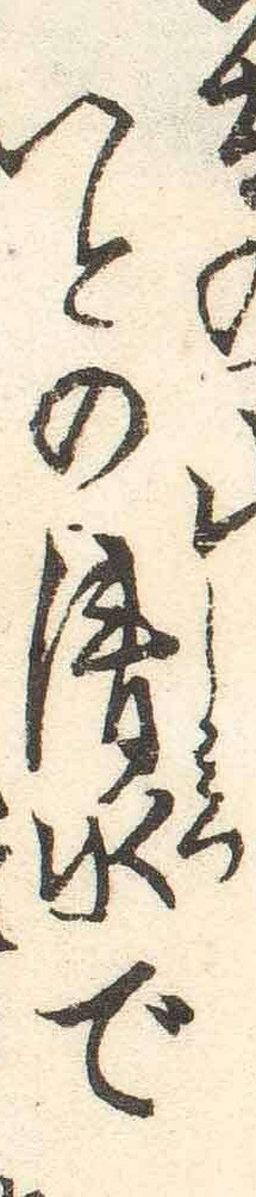いとの清水で

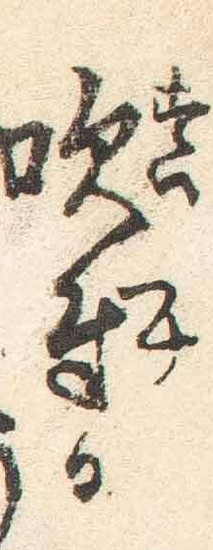吹付る
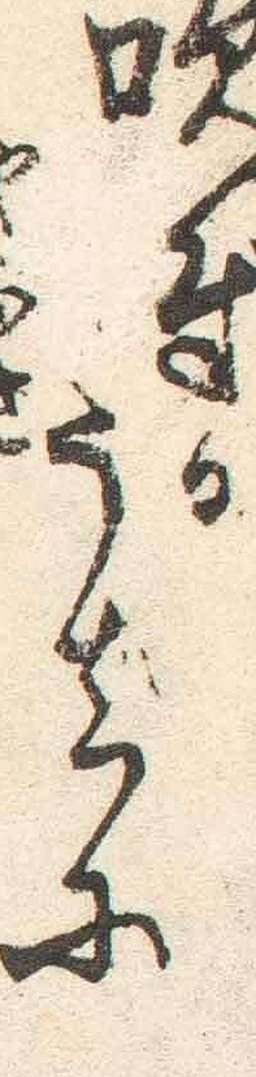うちに
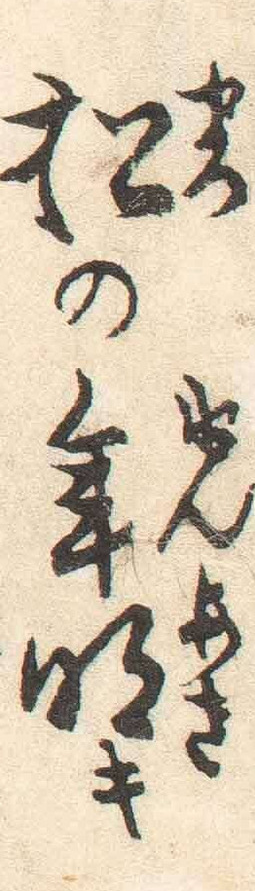松の年明き
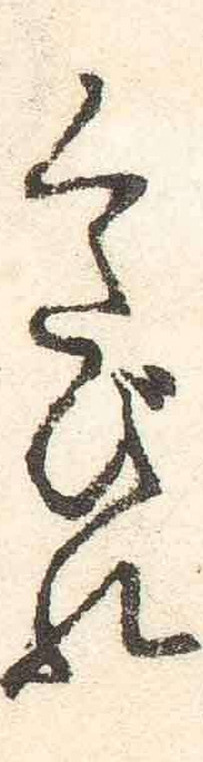くたびれ
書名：画本柳樽
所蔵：東京学芸大学附属図書館 国文学研究資料館
